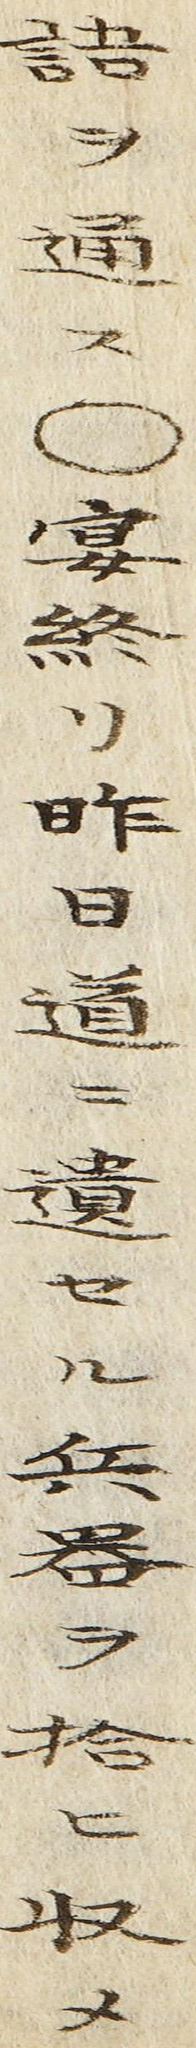語ヲ通ス◯宴終リ昨日道ニ遺セル兵器ヲ拾ヒ収メ
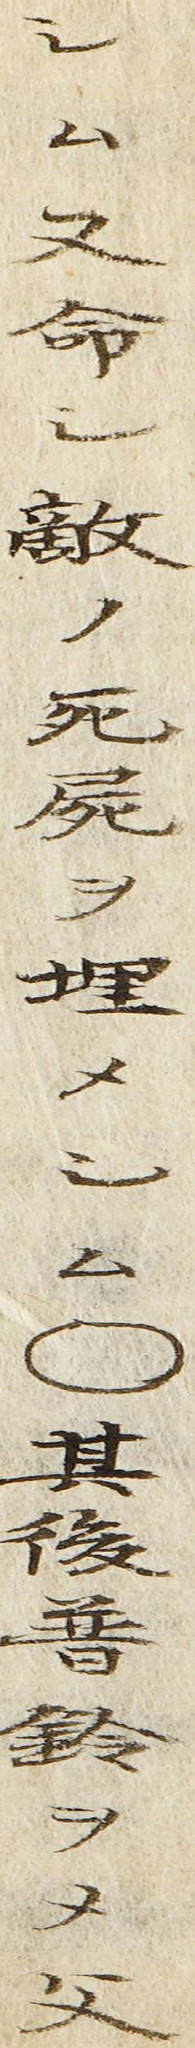シム又命シ敵ノ死屍ヲ埋メシム◯其後普鈴ヲシテ父
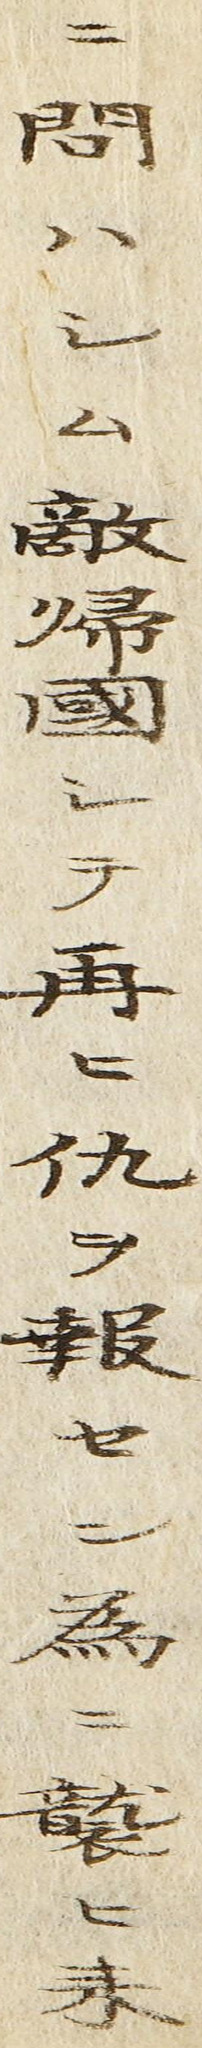ニ問ハシム敵帰国シテ再ヒ仇ヲ報セン為ニ襲ヒ来
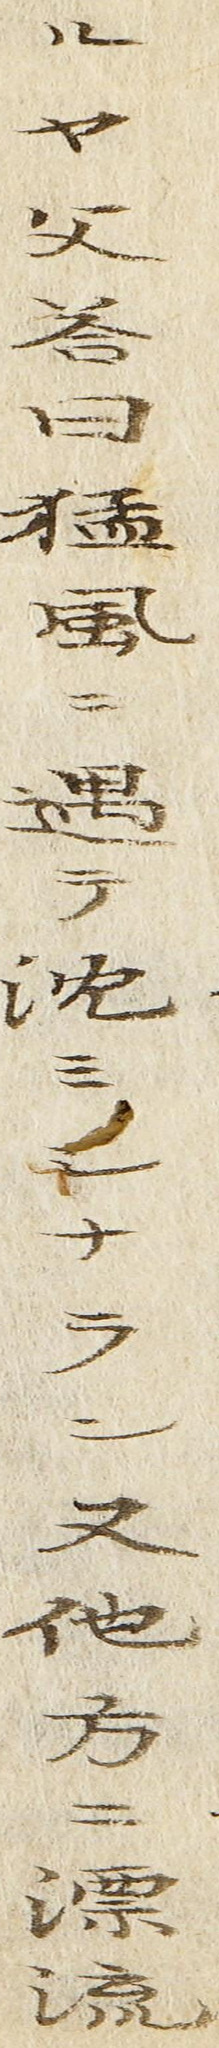ルヤ父答曰猛風ニ遇テ沈ミシナラン又他方ニ漂流
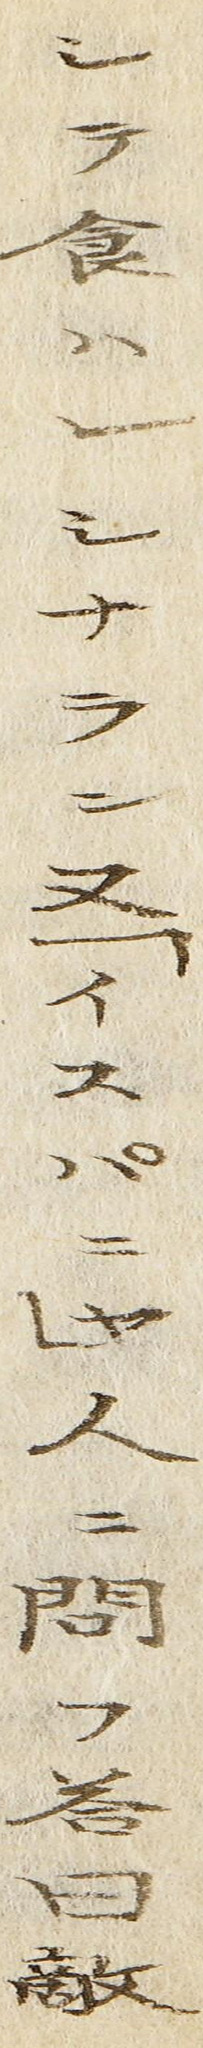シテ食ハレシナラン又「イスパニヤ」人ニ問フ答曰敵
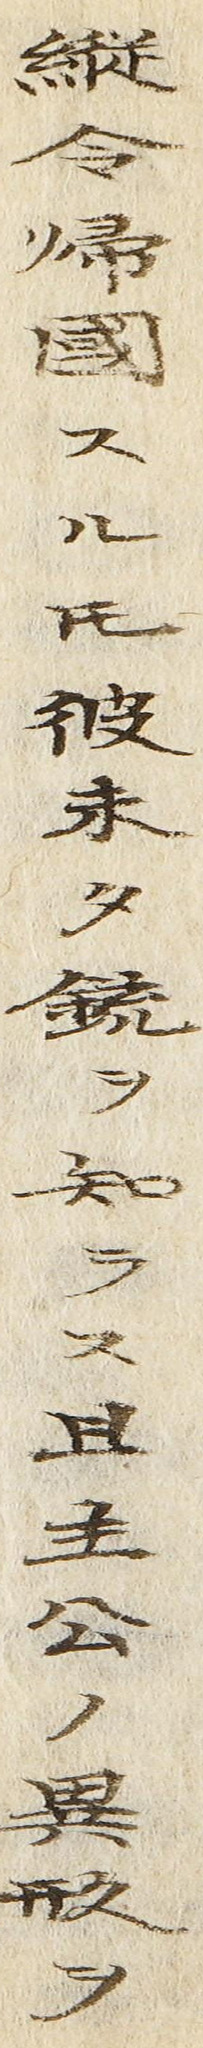縦令帰国スルトモ彼未タ銃ヲ知ラス且主公ノ異形ヲ
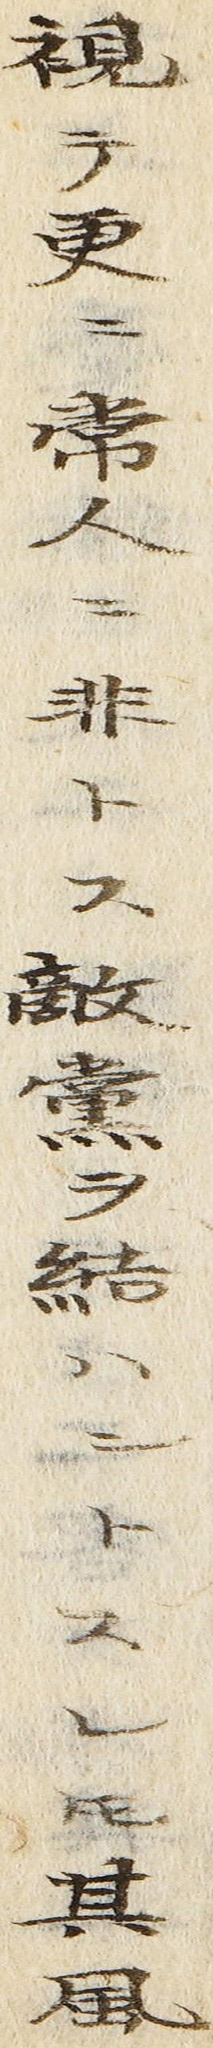視テ更ニ常人ニ非トス敵党ヲ結ハントスレトモ其風
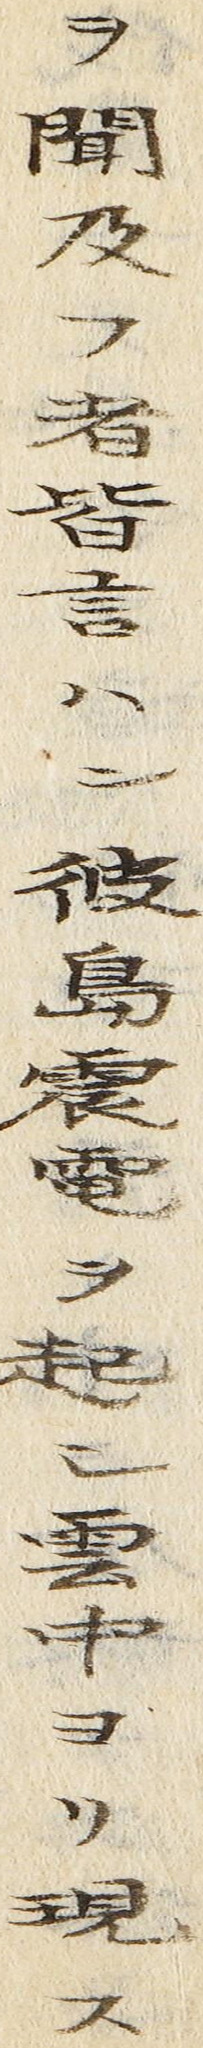ヲ聞及フ者皆言ハン彼島震電ヲ起シ雲中ヨリ現ス
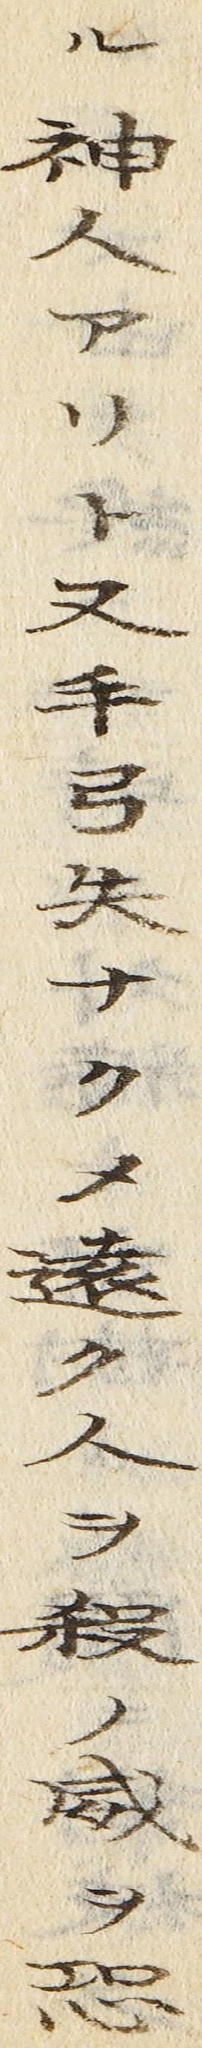ル神人アリト又手弓矢ナクシテ遠ク人ヲ殺ノ威ヲ恐
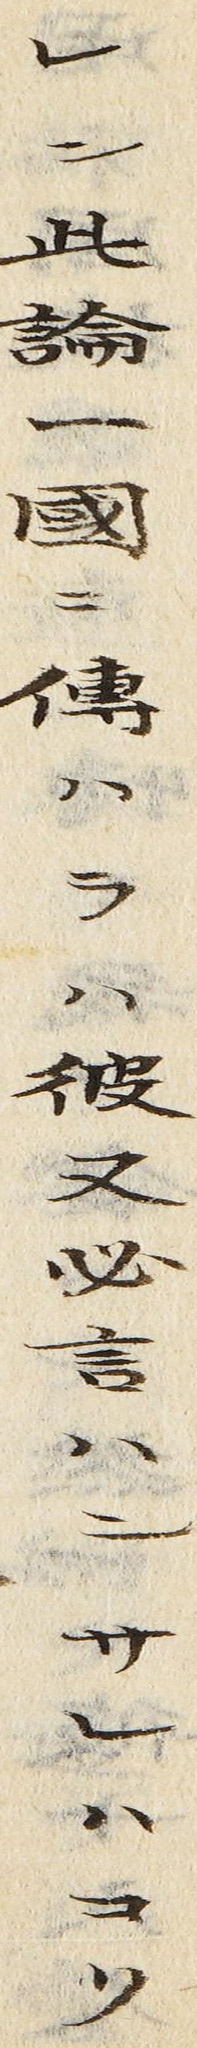レン此論一国ニ伝ハラハ彼又必言ハンサレハヨリ
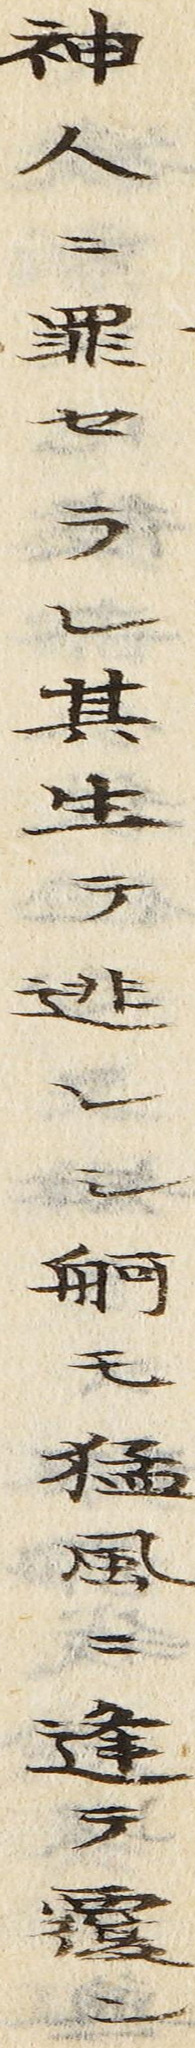神人ニ罪セラレ其生テ逃レシ舸モ猛風ニ逢テ覆ン
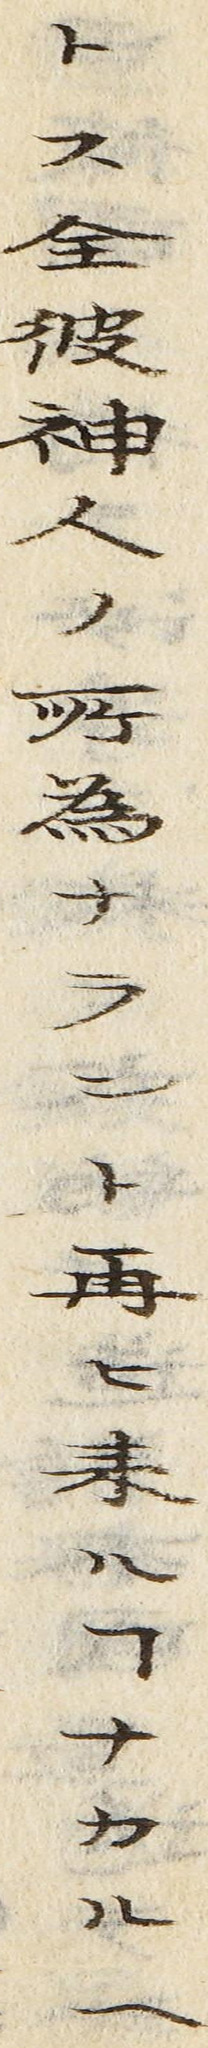トス全彼神人ノ所為ナラント再ヒ来ルコトナカルヘ
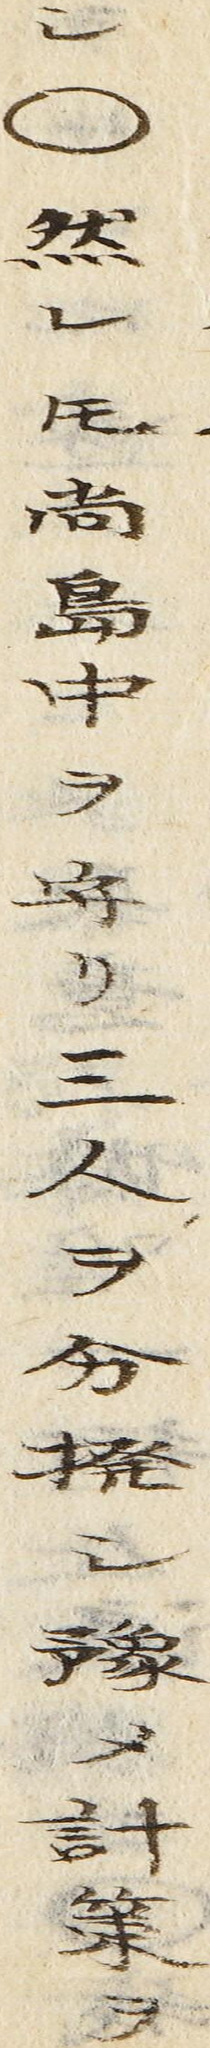シ◯然レトモ尚島中ヲ守リ三人ヲ分撥シ予メ計策ヲ
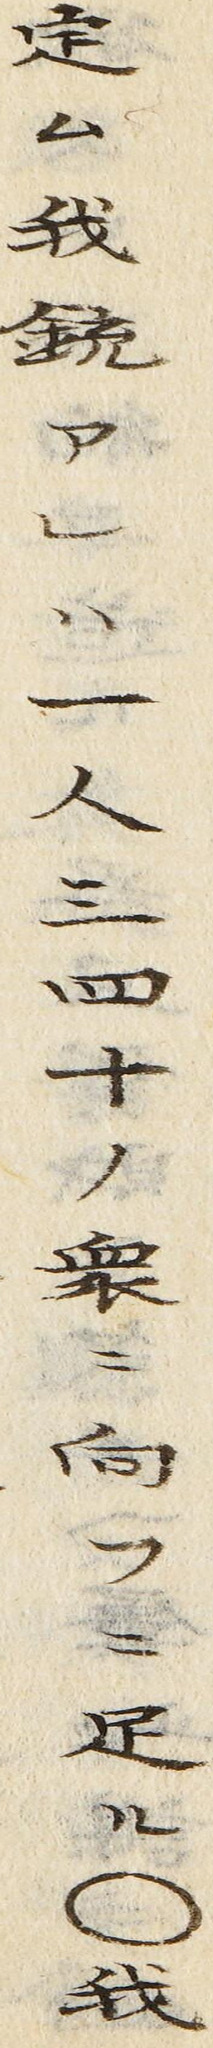定ム我銃アレハ一人三四十ノ衆ニ向フニ足ル◯我
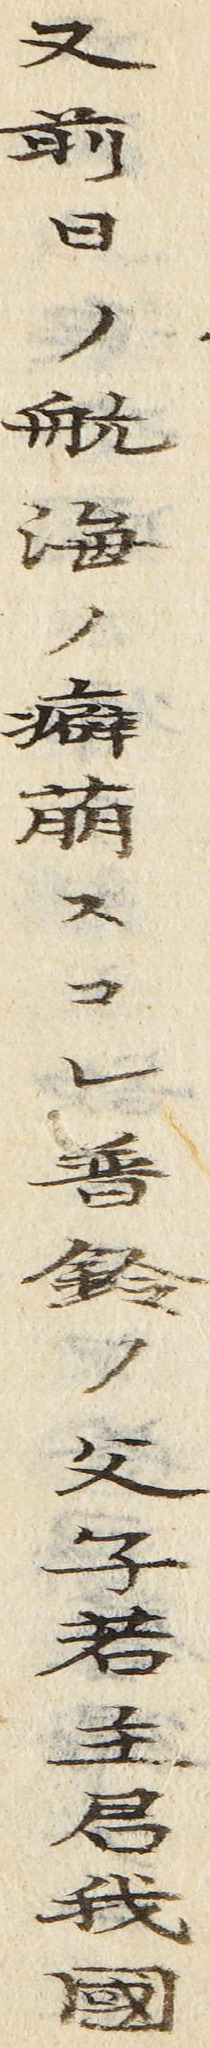又前日ノ航海ノ癖萌スコレ普鈴ノ父子若主君我国
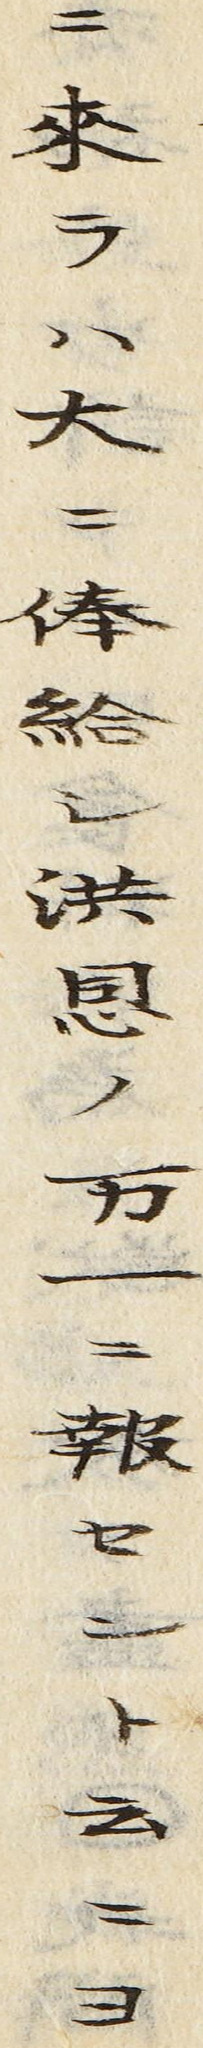ニ来ラハ大ニ俸給シ洪恩ノ万一ニ報セント云ニヨ
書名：漂流紀事
